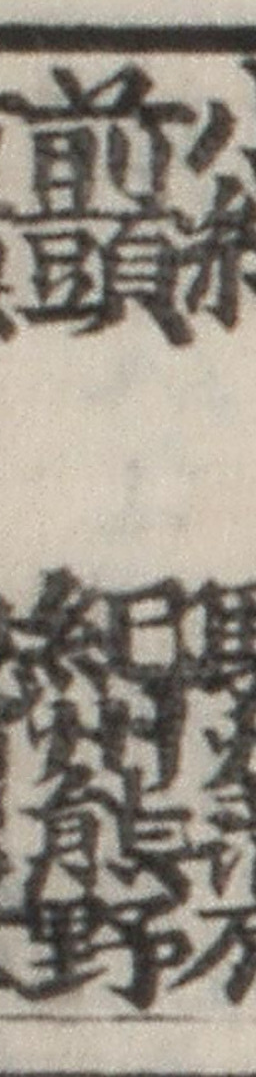前頭紀州熊野
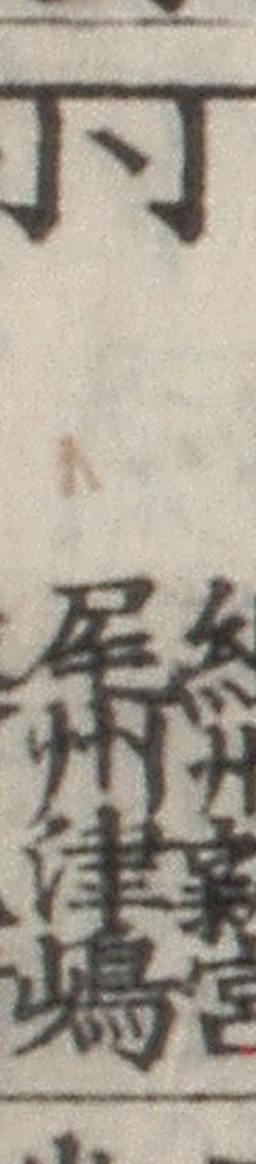同尾州津嶋
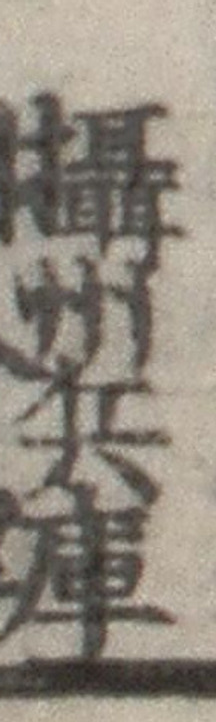摂州兵庫
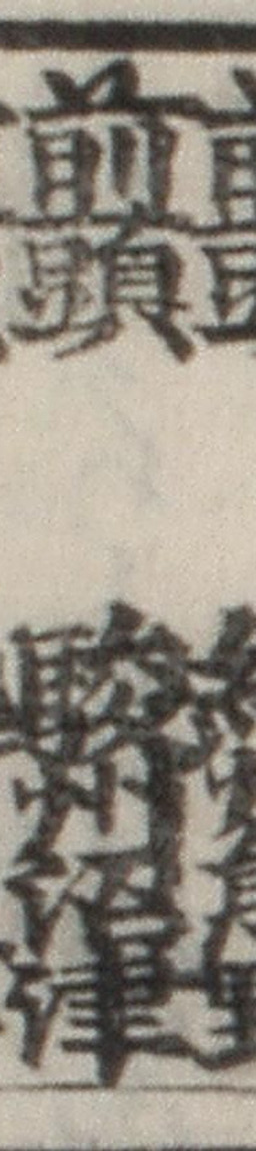前頭駿州沼津
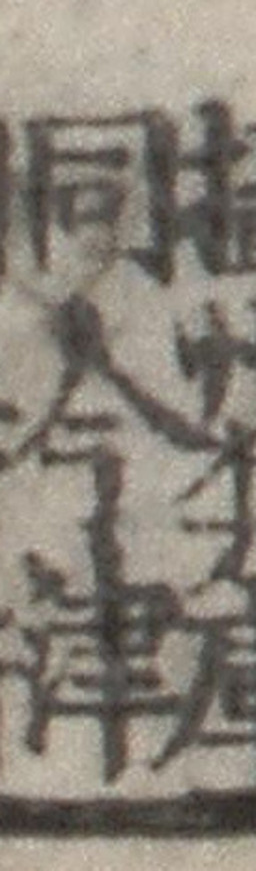同今津
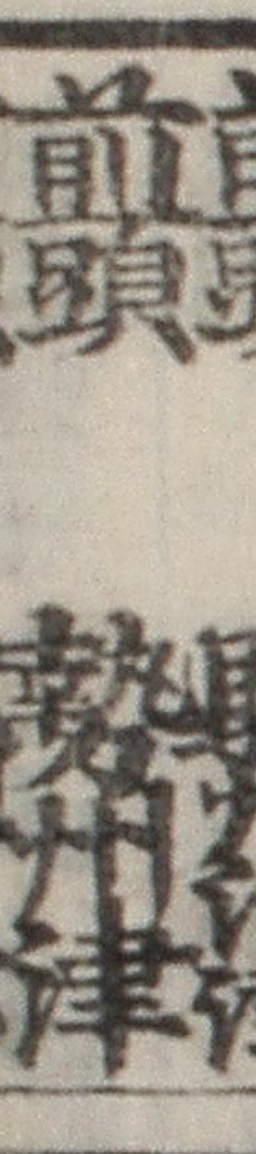前頭勢州津
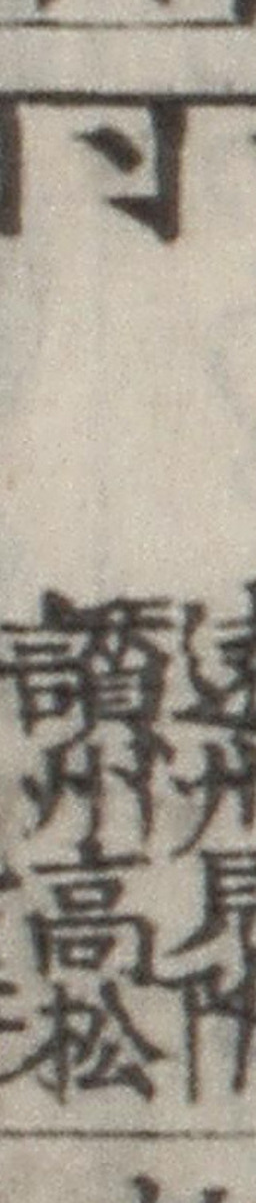同讃州高松
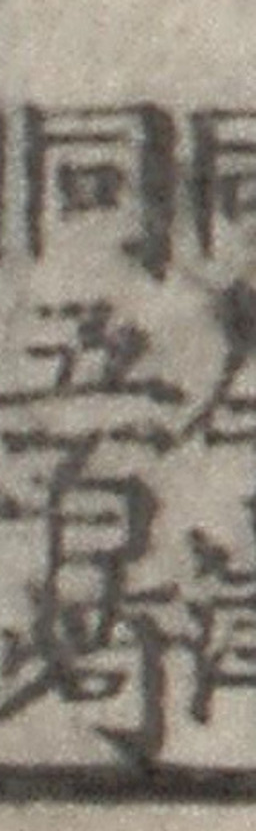同五百崎
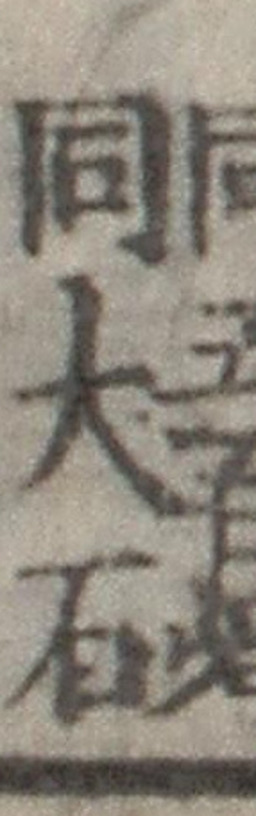同大石
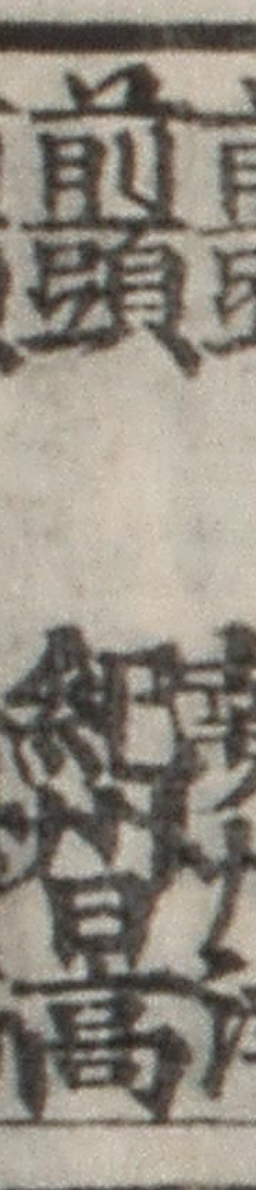前頭紀州日高
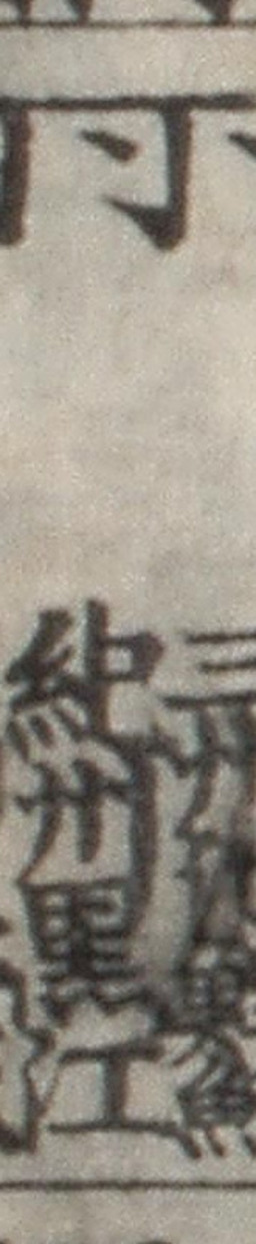同紀州黒江
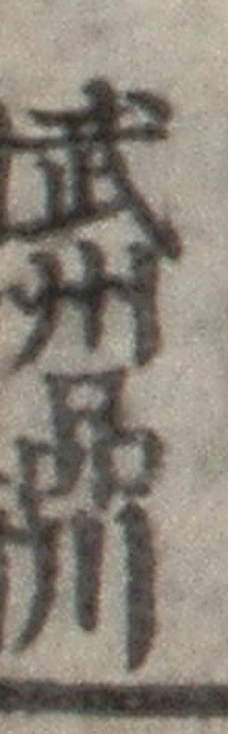武州品川
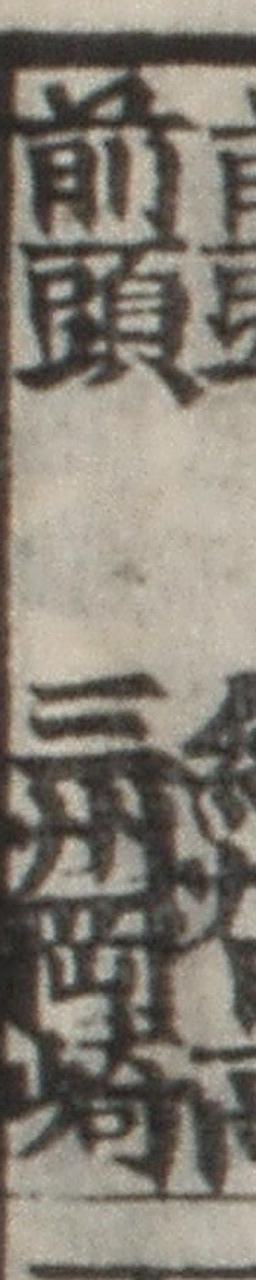前頭三州御油
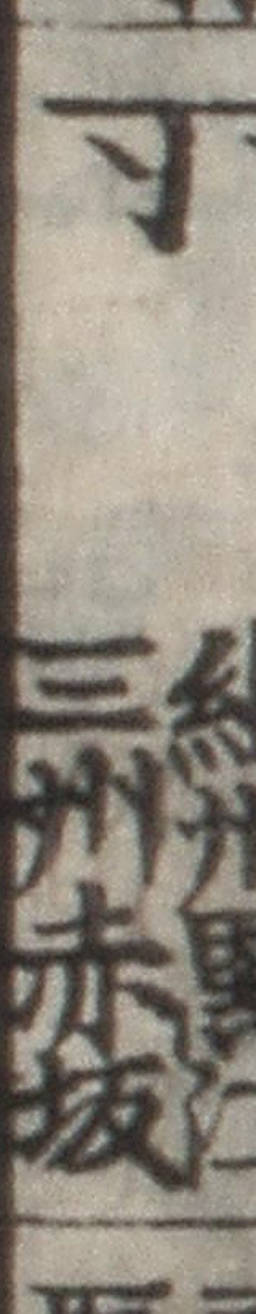同三州赤坂
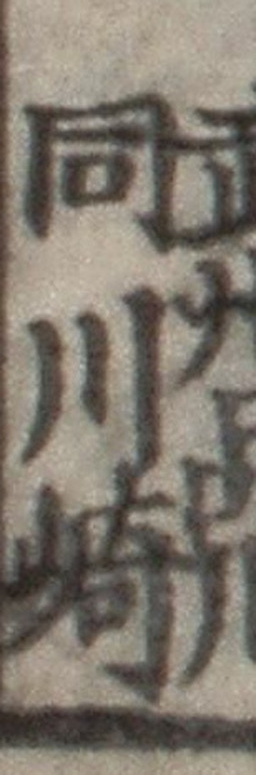同川崎

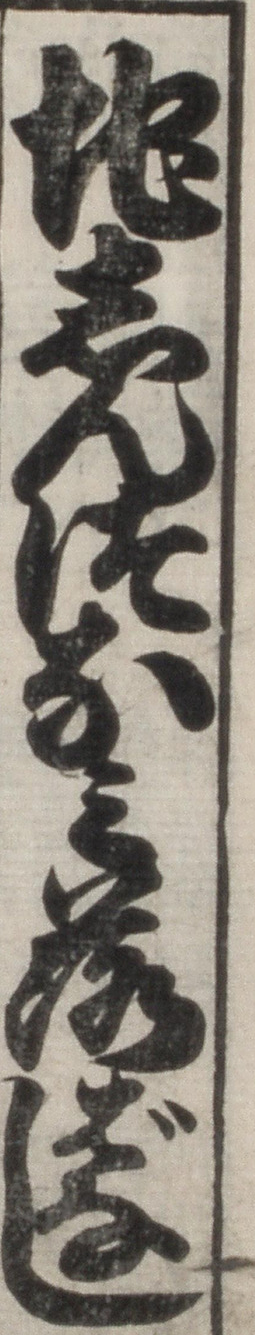地しんつなみ落ばなし
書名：諸國大地震年代記　末代噺種
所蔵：東京大学地震研究所図書室 Earthquake Research Institute Library, The University of Tokyo, JAPAN
